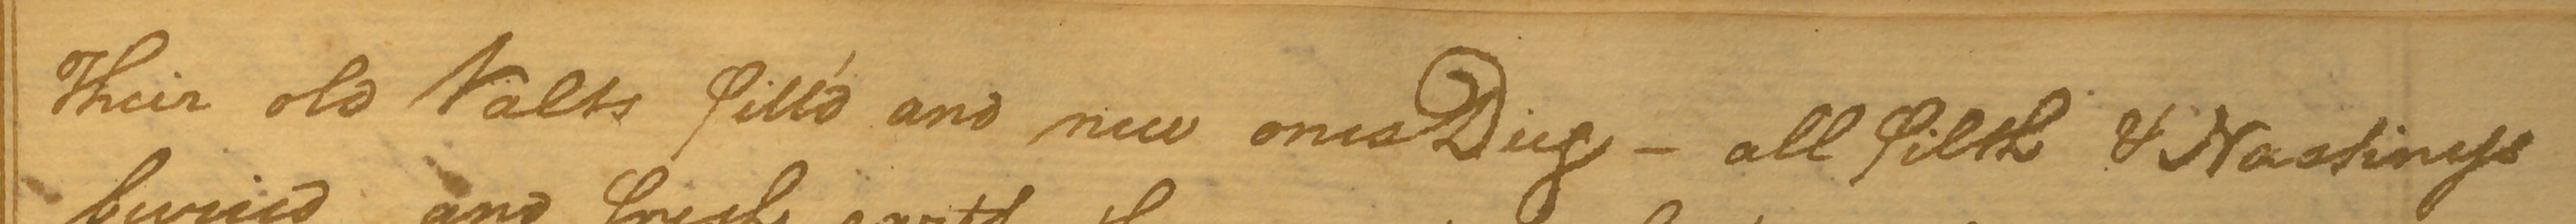Their old Valts fill'd and new ones Dug- all filth & Nastiness
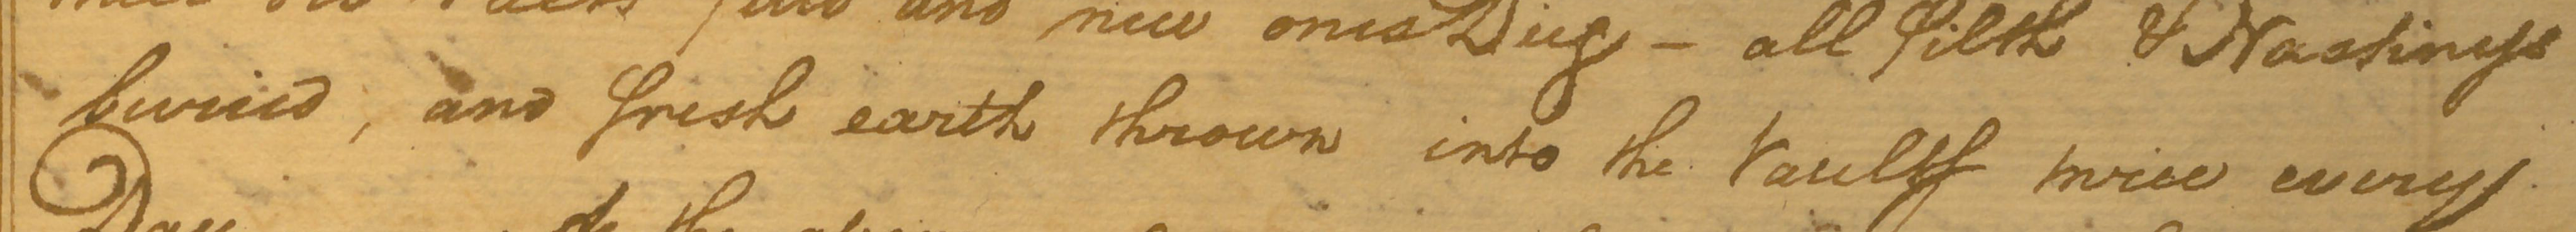buried, and fresh earth thrown into the Vaults twice every
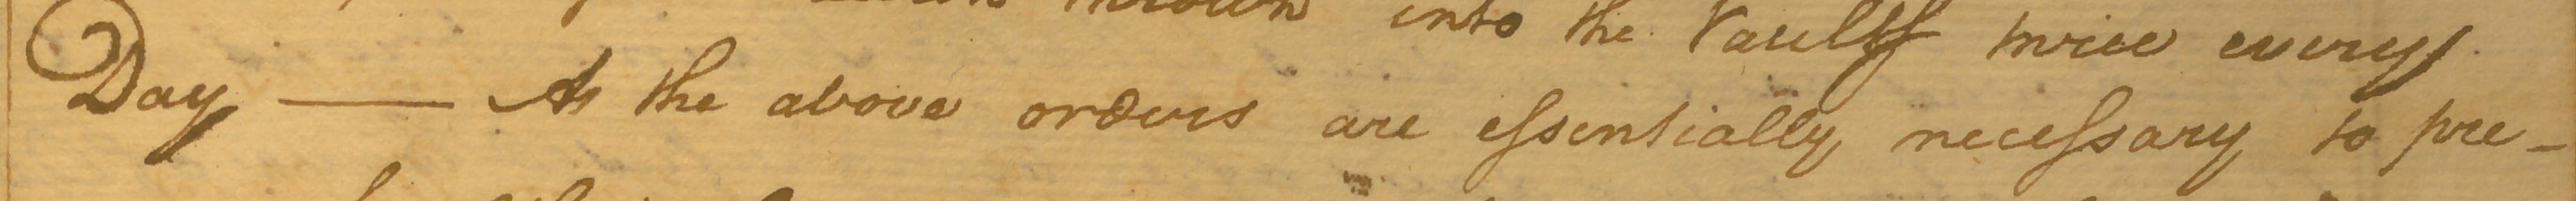Day- As the above orders are essentially necessary to pre-
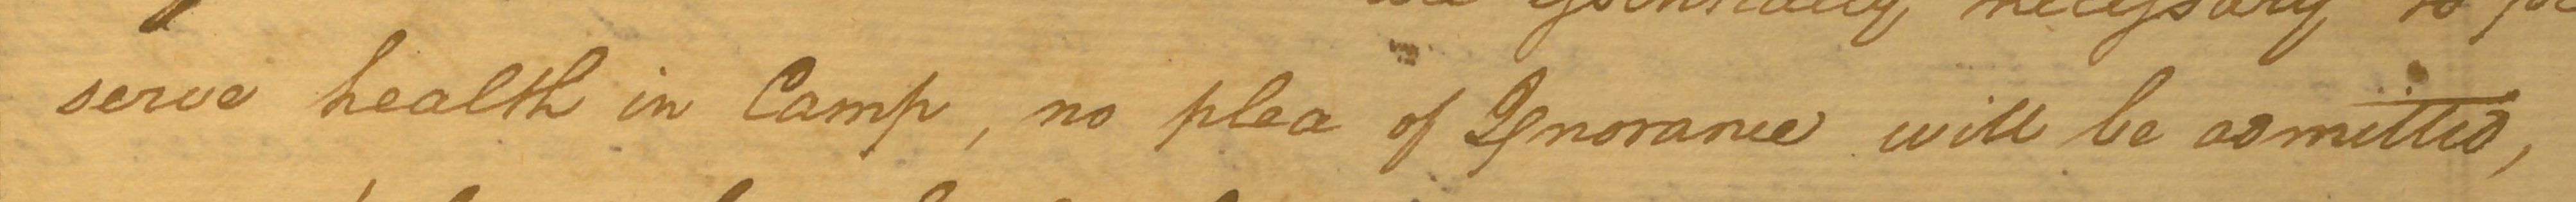serve health in Camp, no plea of Ignorance will be admitted,
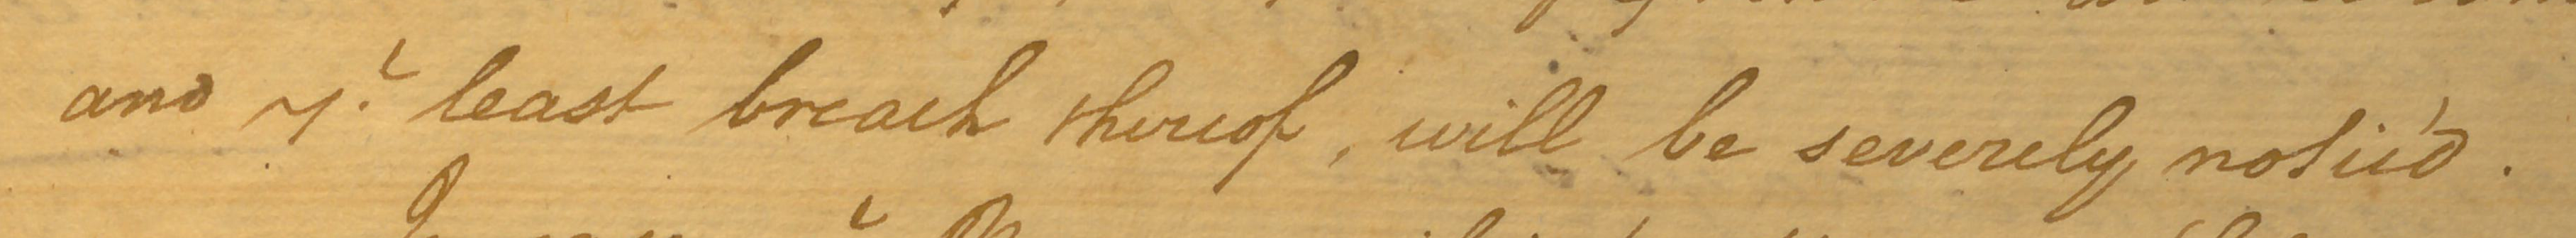and y^e. least breach thereof, will be severely notic'd.
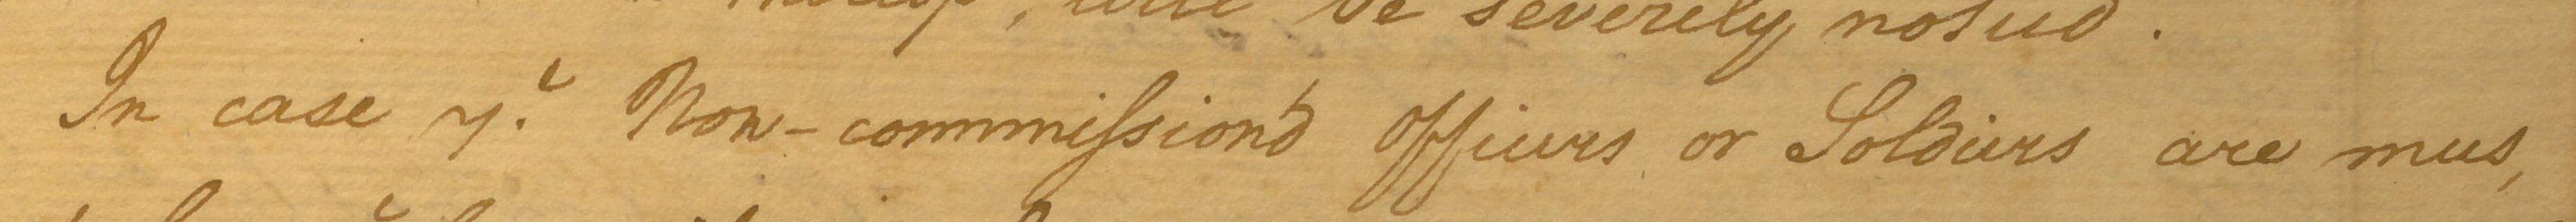In case y^e. Non-commission'd Officers or Soldiers are mus
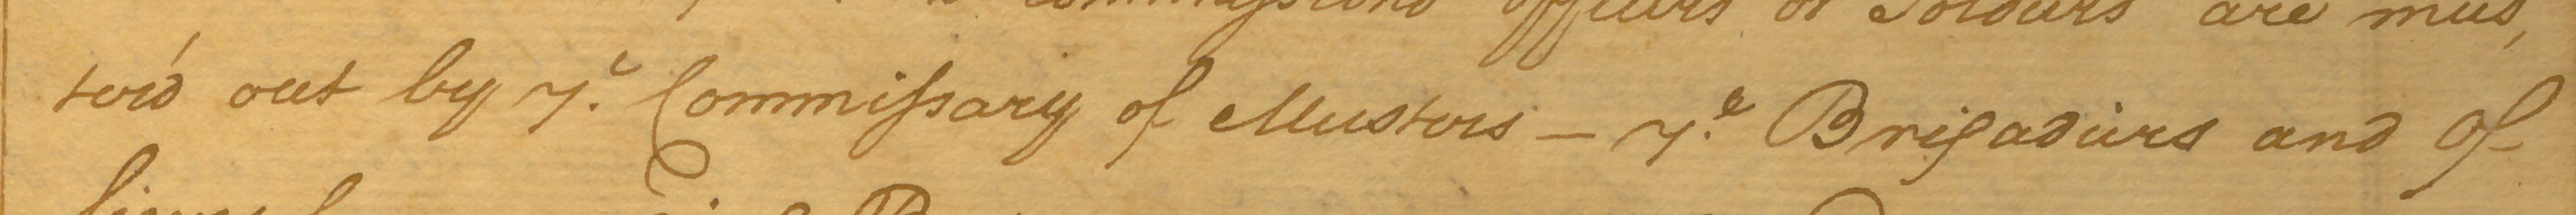ter'd out by y^e. Commissary of Musters- y^e. Brigadiers and of-
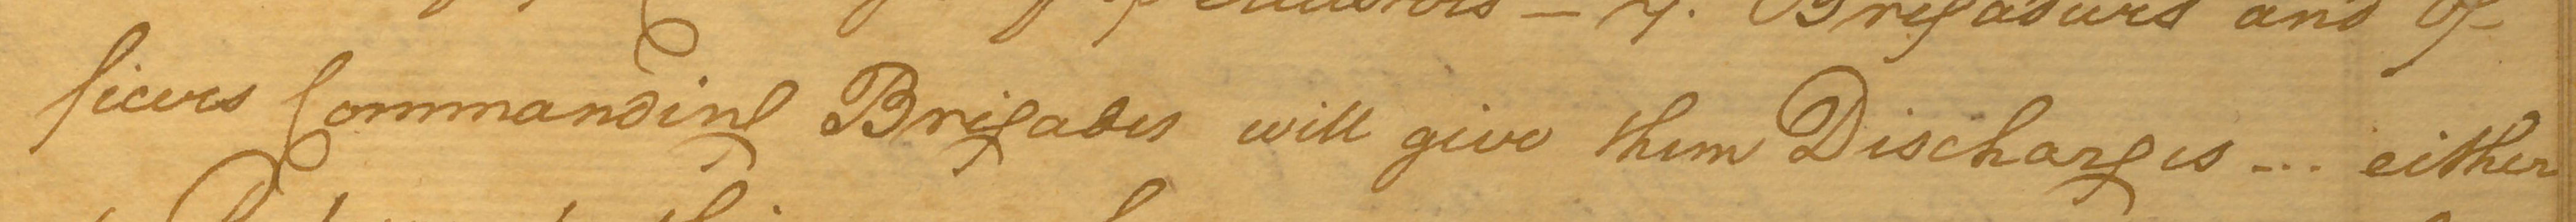ficers Commanding Brigades will give them Discharges... either
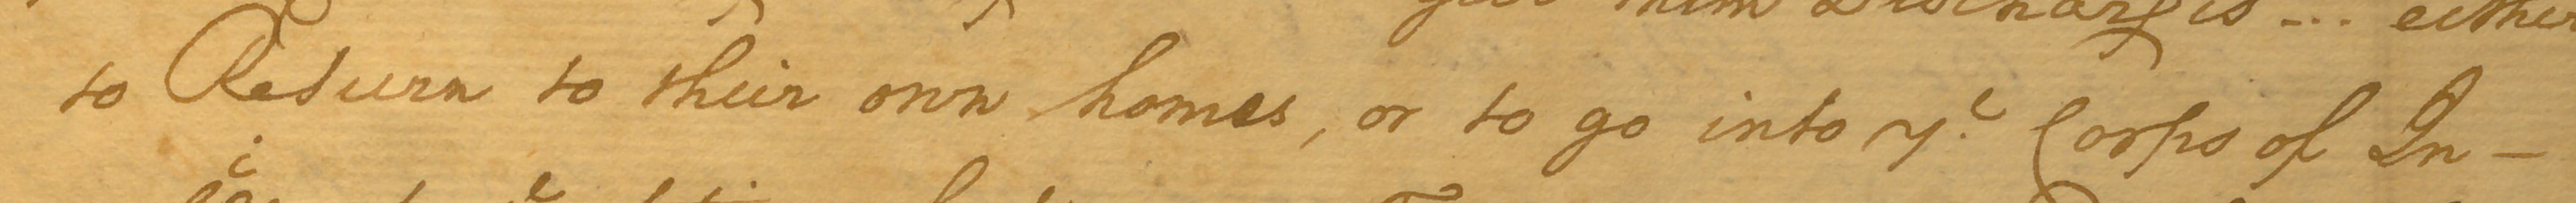to Return to their own homes, or to go into y^e. Corps of In-
